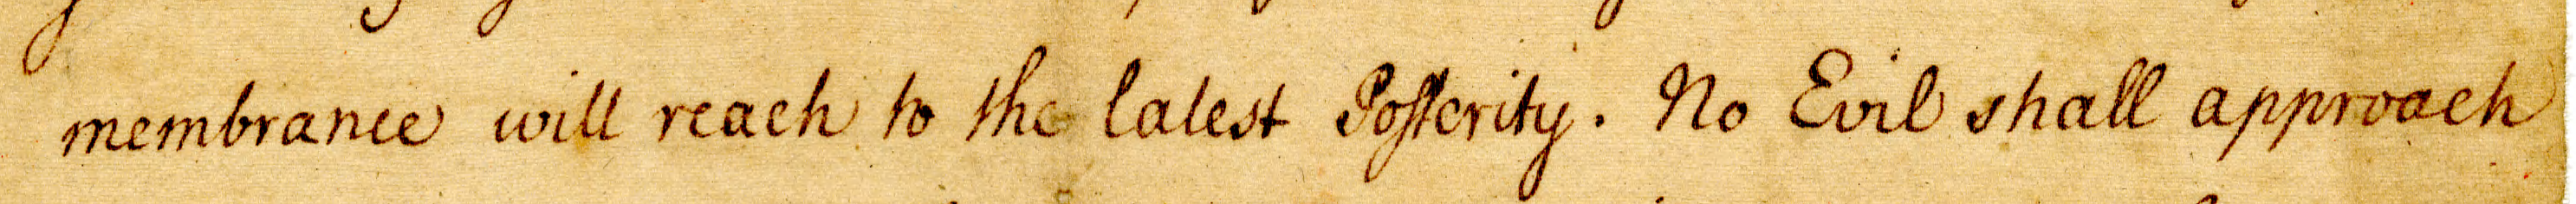membrance will reach to the latest Posterity. No Evil shall approach
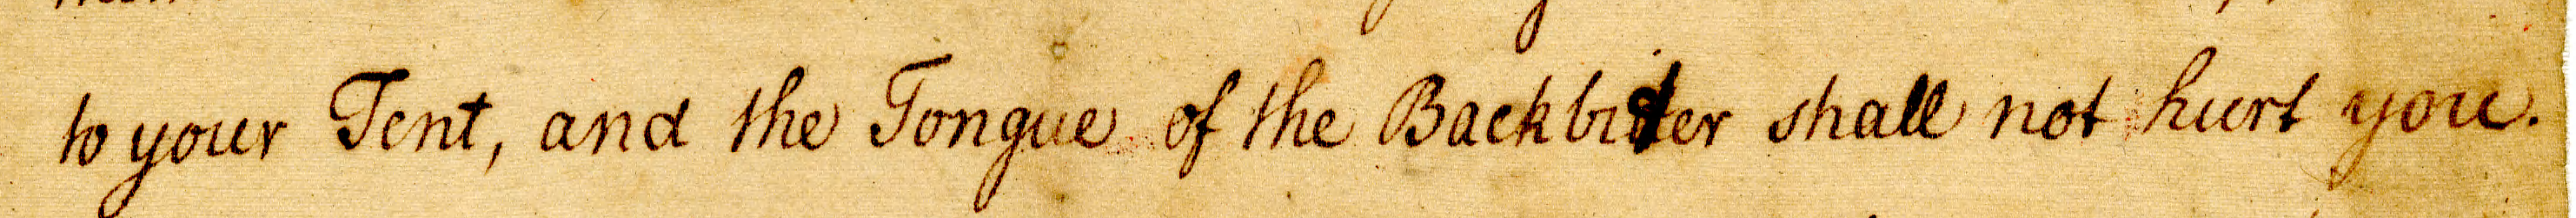to your Tent, and the Tongue of the Backbiter shall not hurt you.
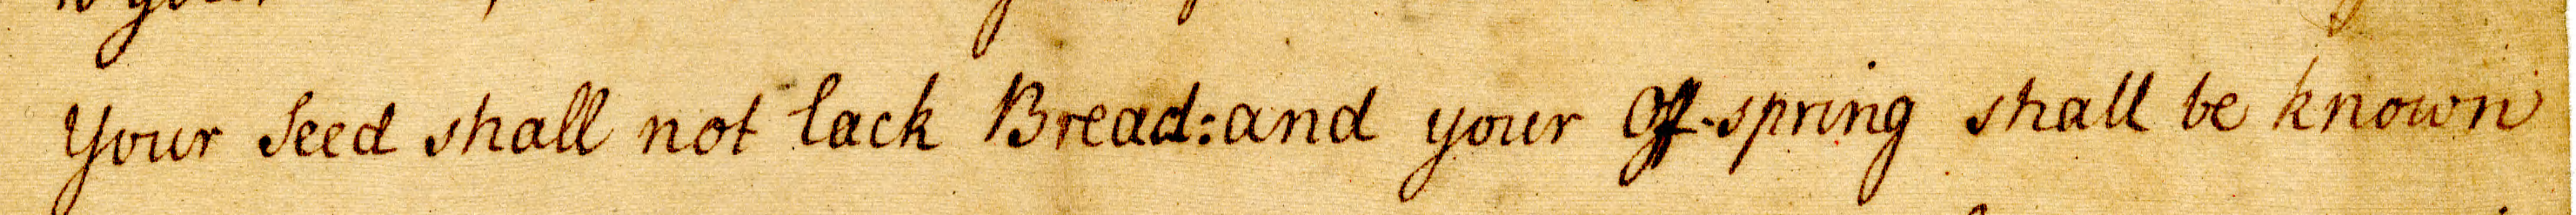Your seed shall not lack Bread: and your off-spring shall be known
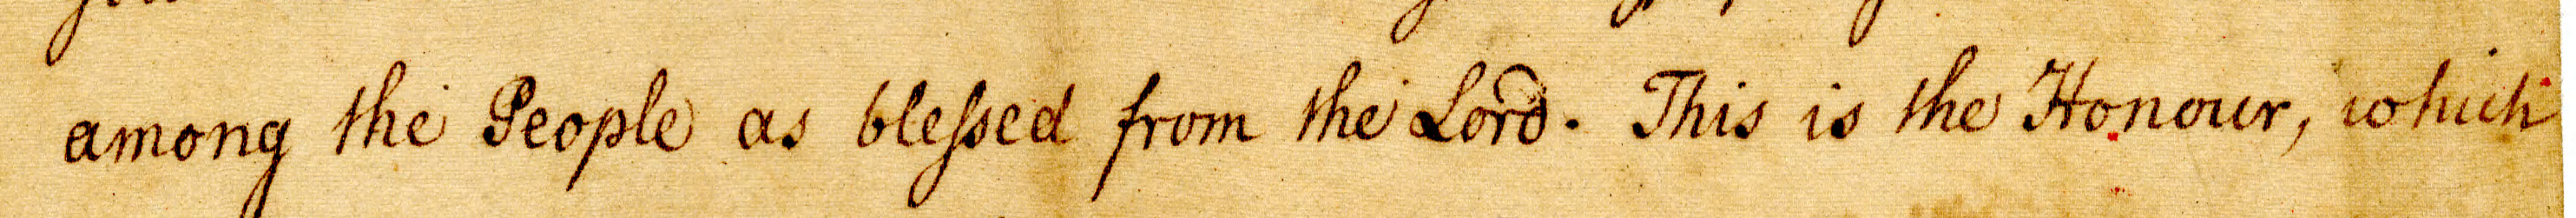among the People as blessed from the Lord. This is the Honour, which
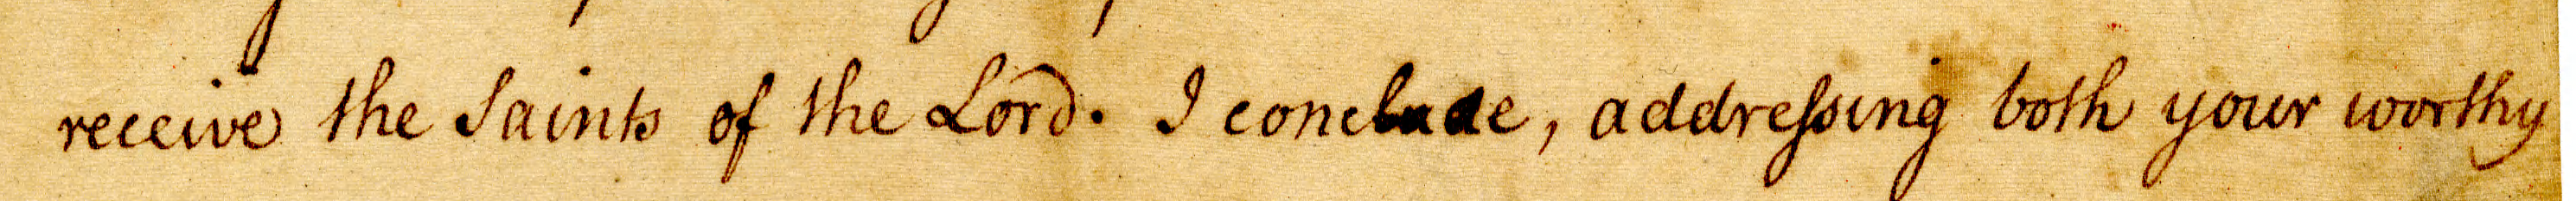receive the Saints of the Lord. I conclude, addressing both your worthy
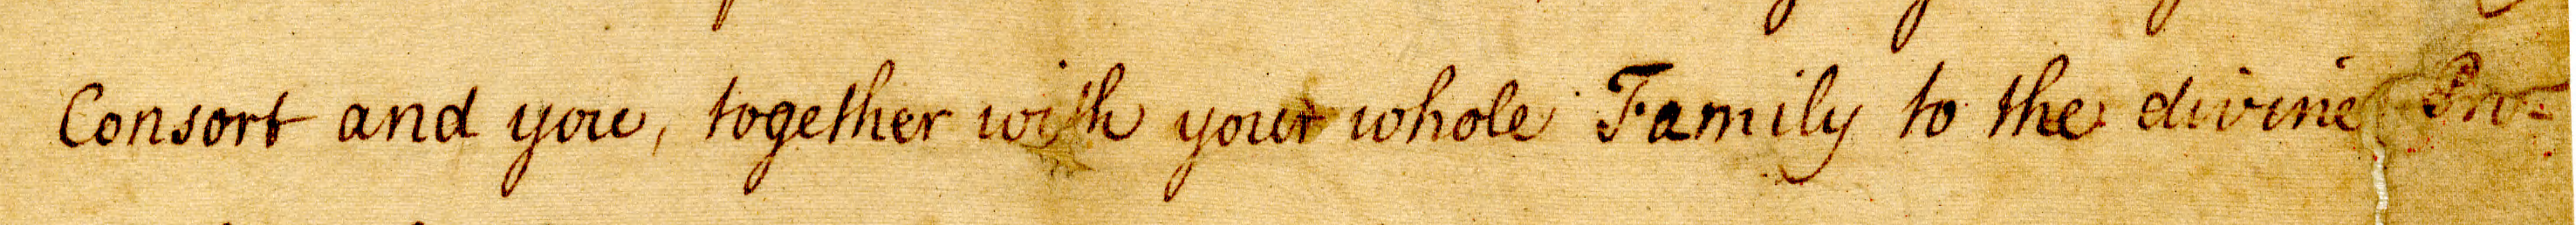consort and you, together with your whole Family to the divine Pro-
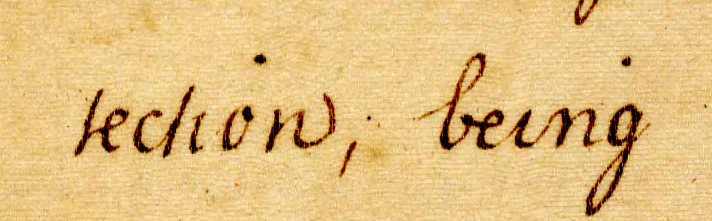tection, being
